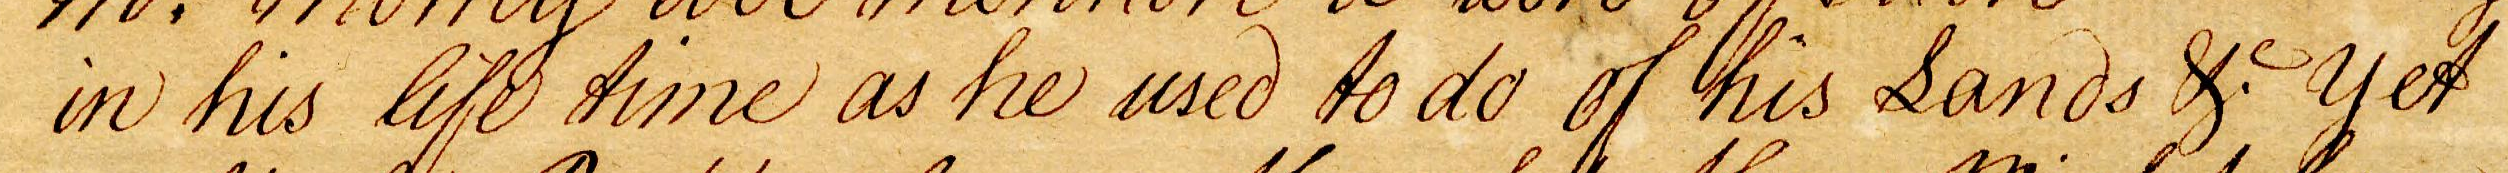in his life time as he used to do of this Lands &^c. Yet
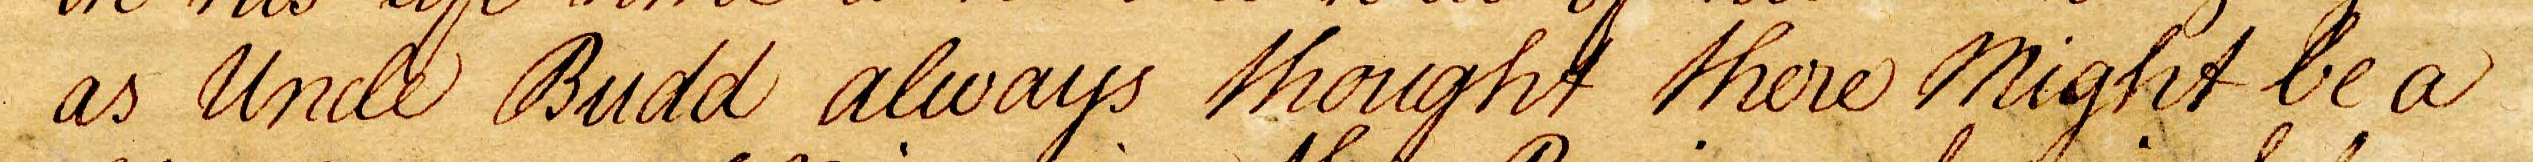as Uncle Budd always thought there Might be a
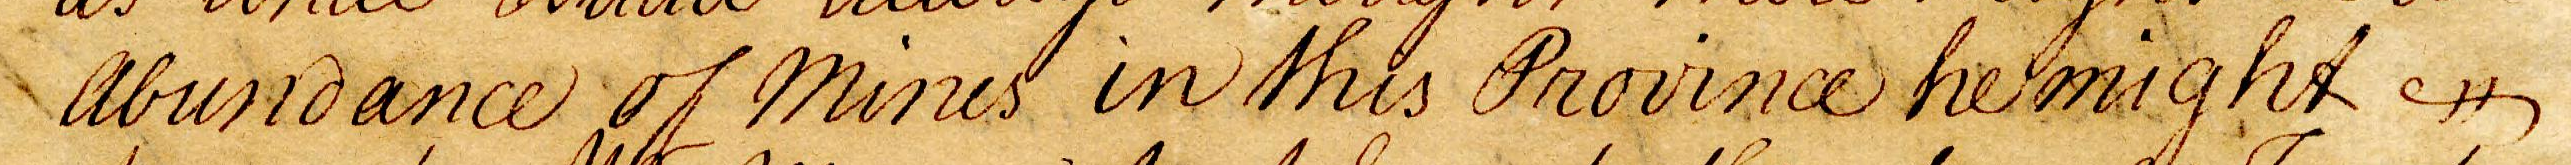Abundance of Mines in this Province he might
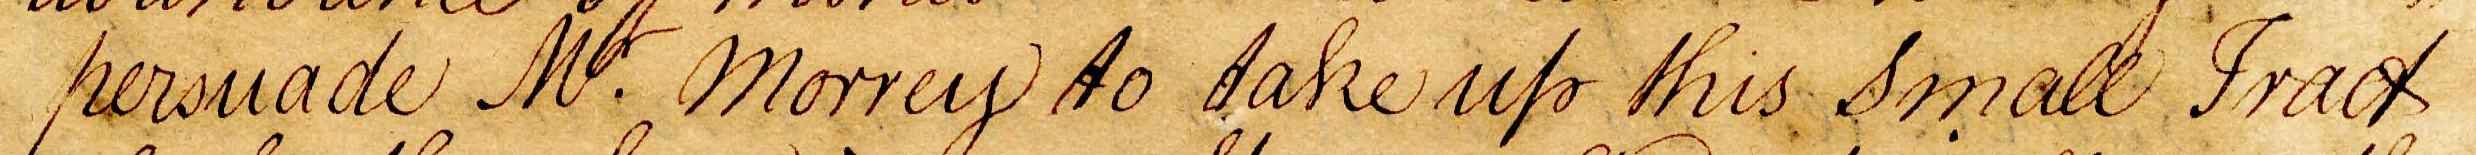persuade M^r. Morrey to take up this small Tract
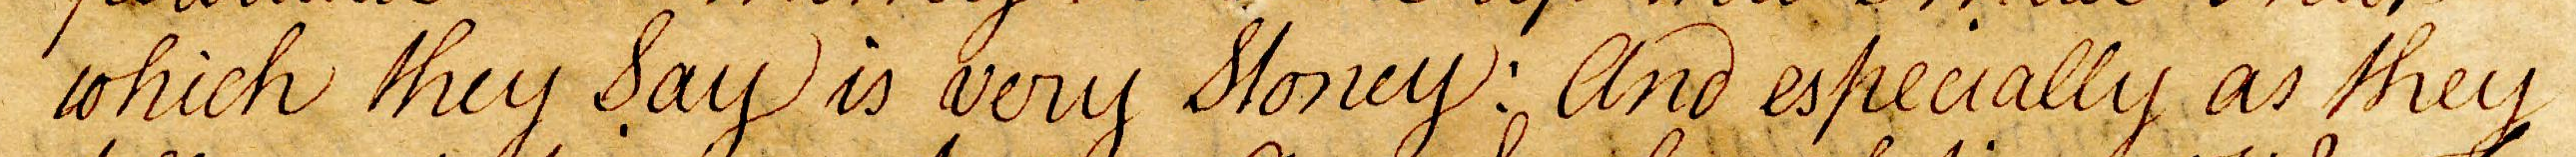which they say is very Stoney: And especially as they
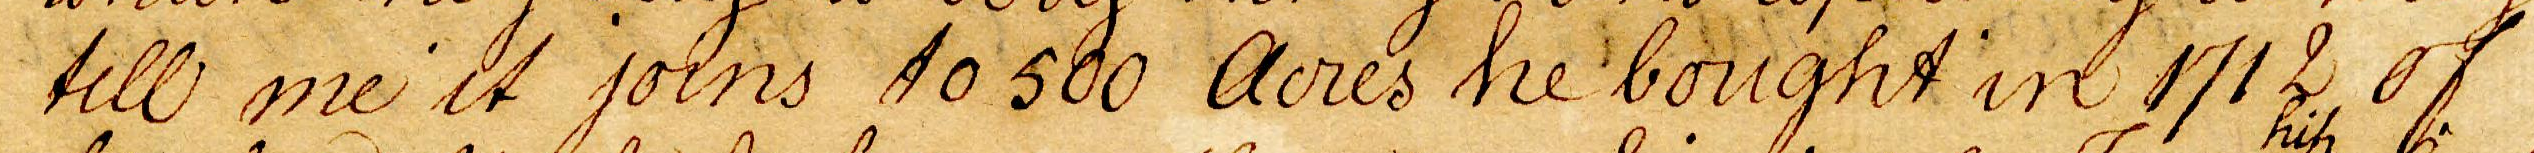tell me it joins to 500 Acres he bought in 1712 of
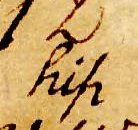his
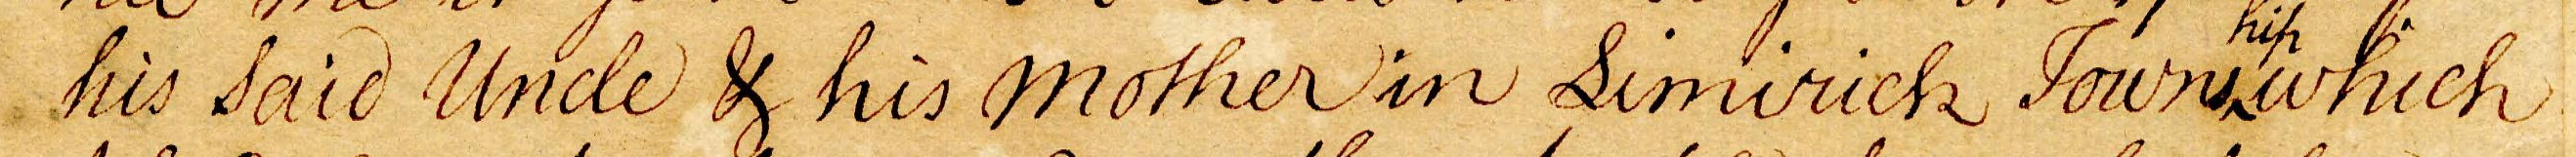his Said Uncle & his Mother in Limirick Town ^ which
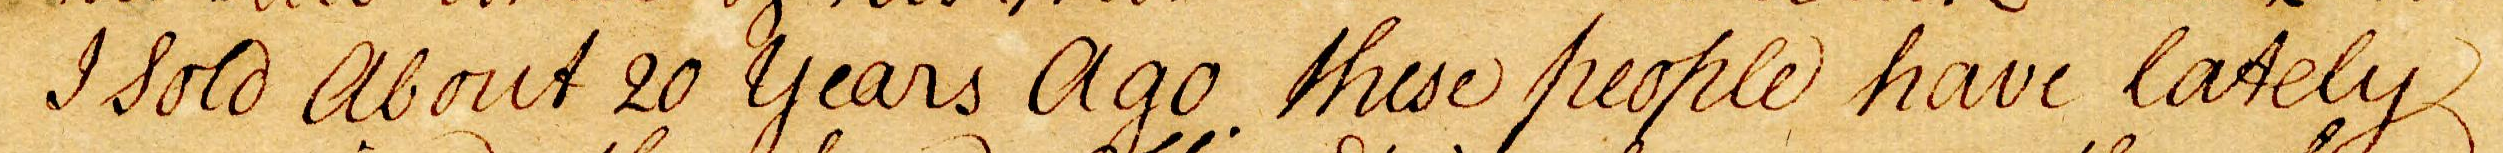I sold About 20 Years Ago these people have lately
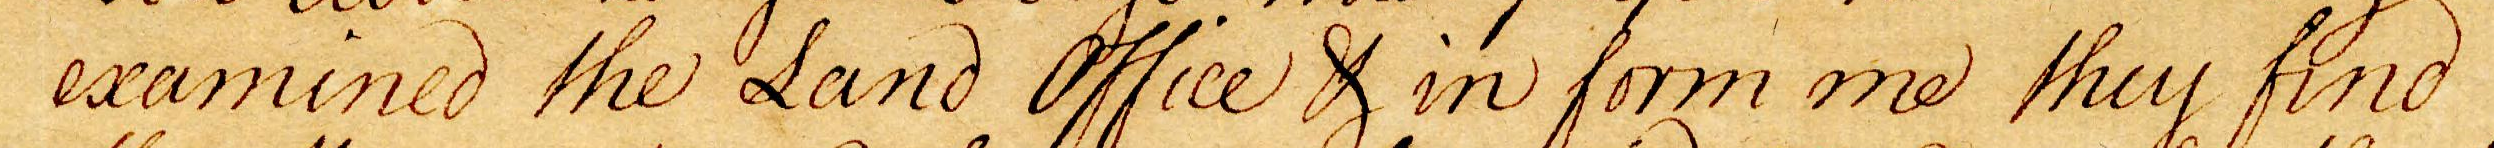examined the Land Office & in form me they find
